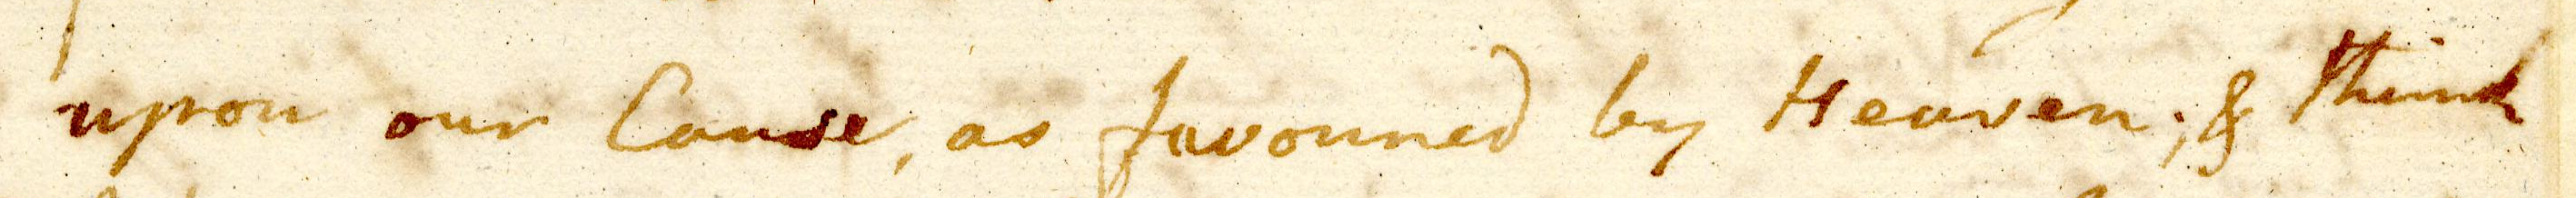upon our Cause as favoured by Heaven; & think
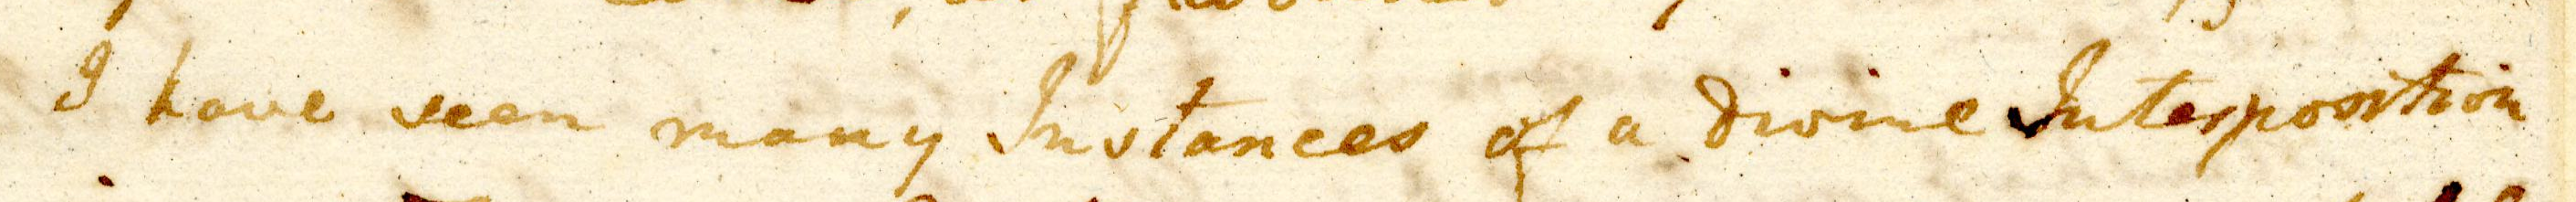I have seen many Instances of a divine Interposition
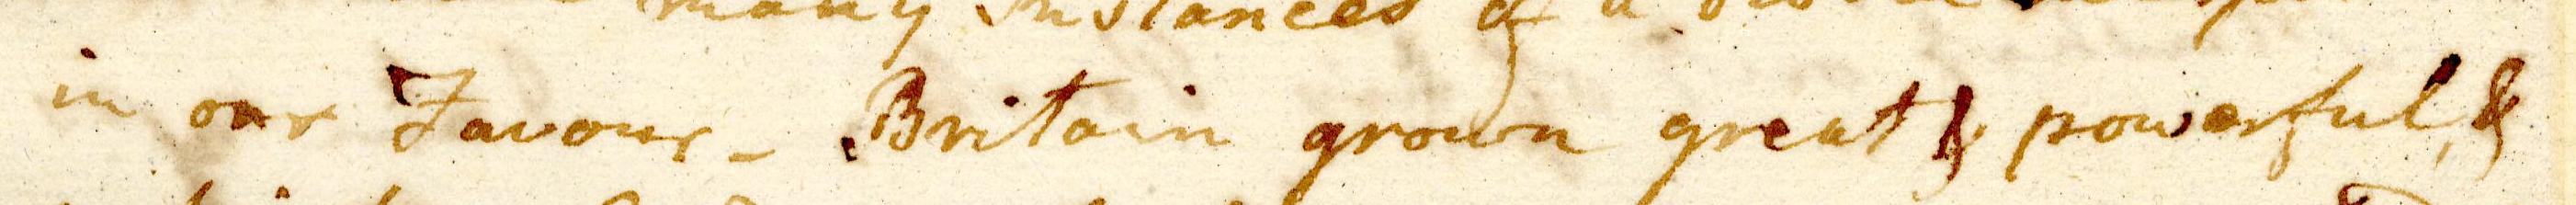in our Favour- Britain grown great & powerful, &
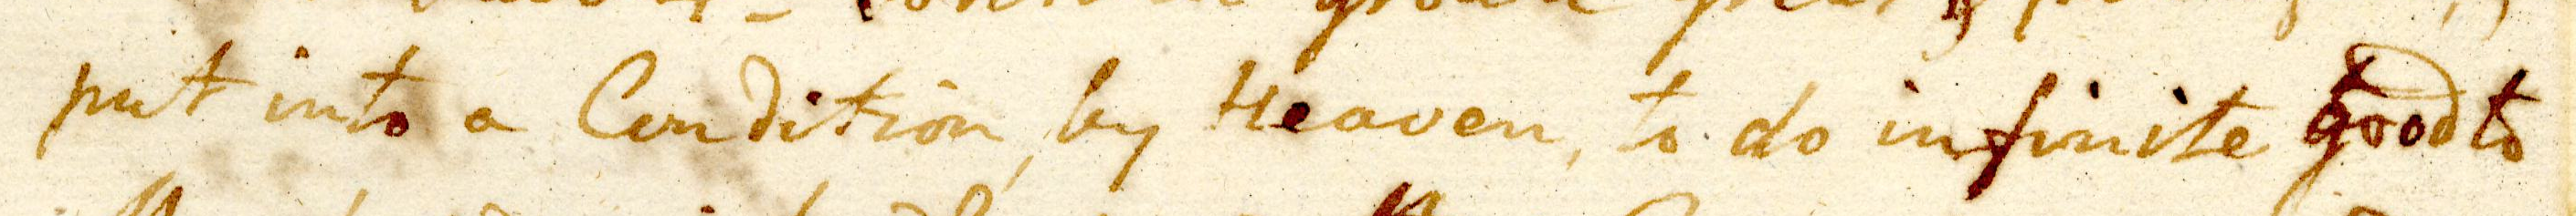put into a Condition by Heaven to do infinite good to
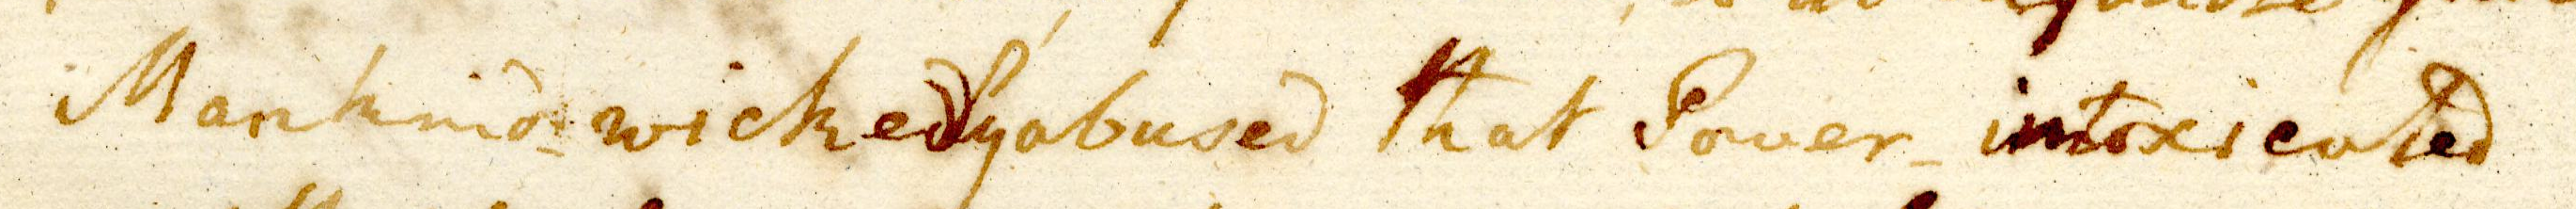Mankind wickedly abused that Power- intoxicated
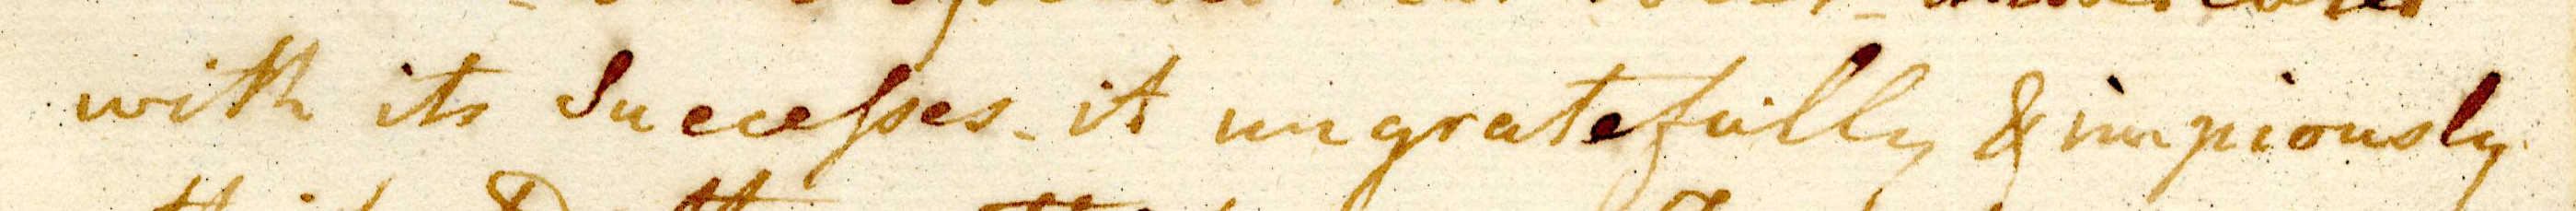with its sucessess, it ungratefully & impiously
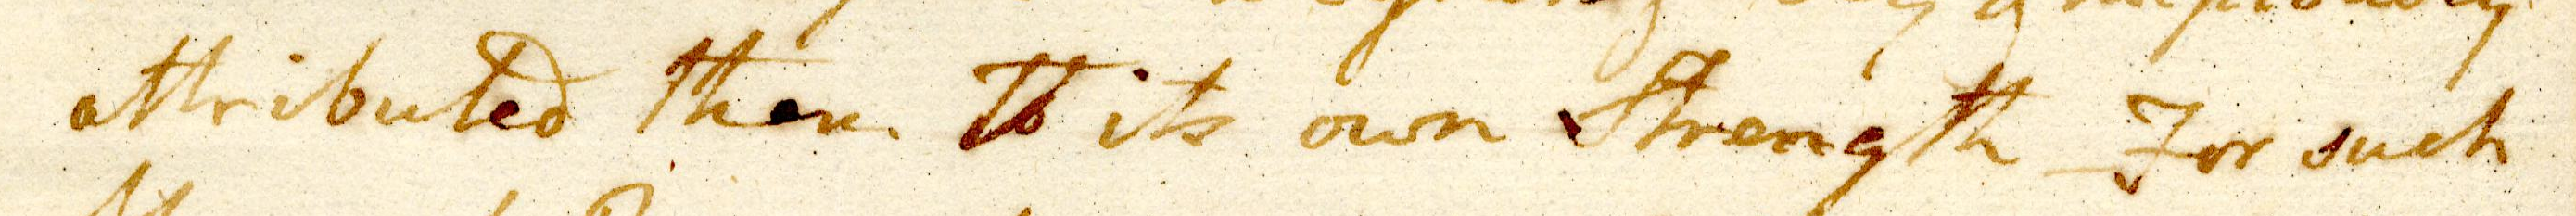attributed them to its own Strength- For such
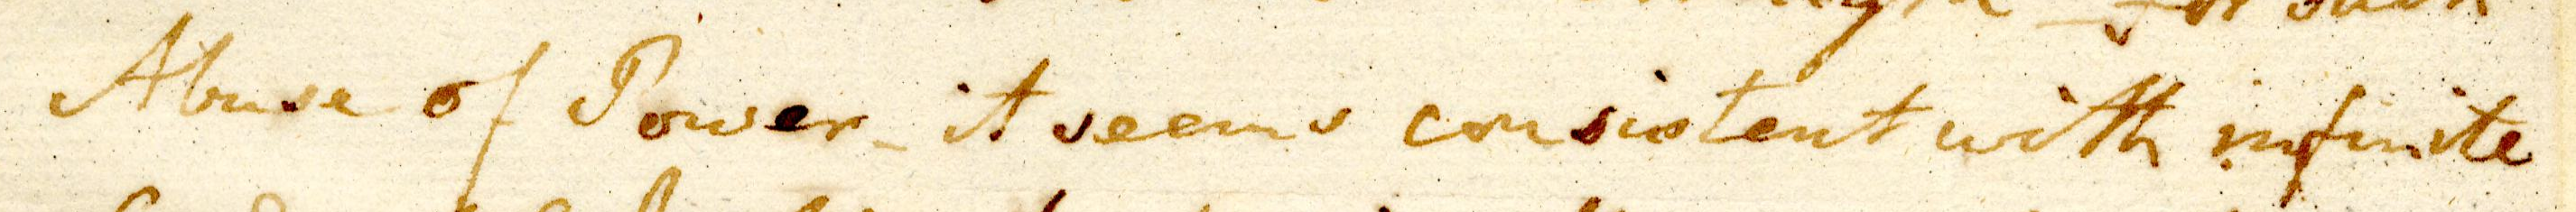Abuse of Power- it seems consistent with infinite
